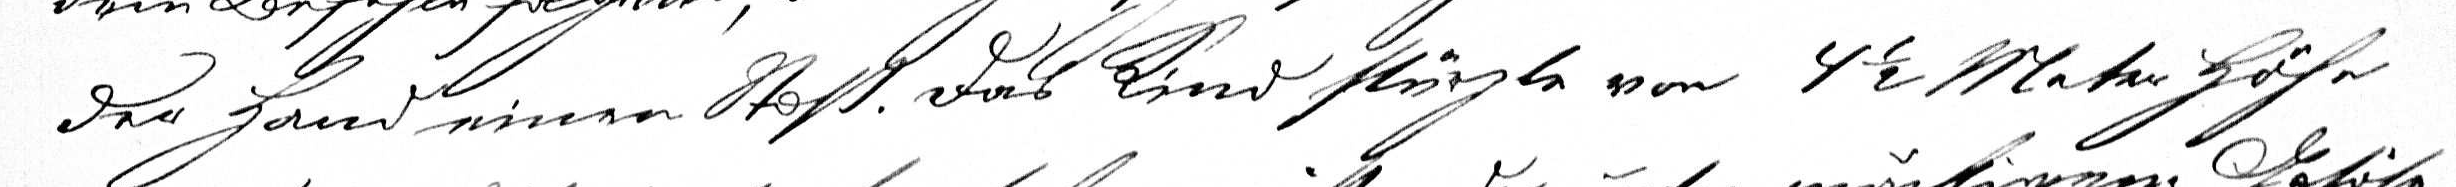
der Hand einen Stoß. Das Kind stürzte von 4 ½ Meter Höhe
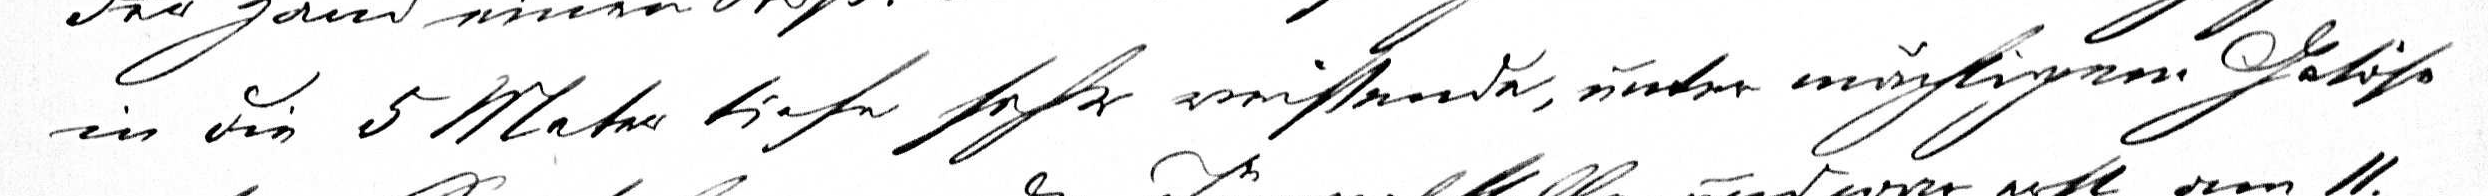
in die 5 Meter tiefe sehr reißende, unter mächtigen Getöse
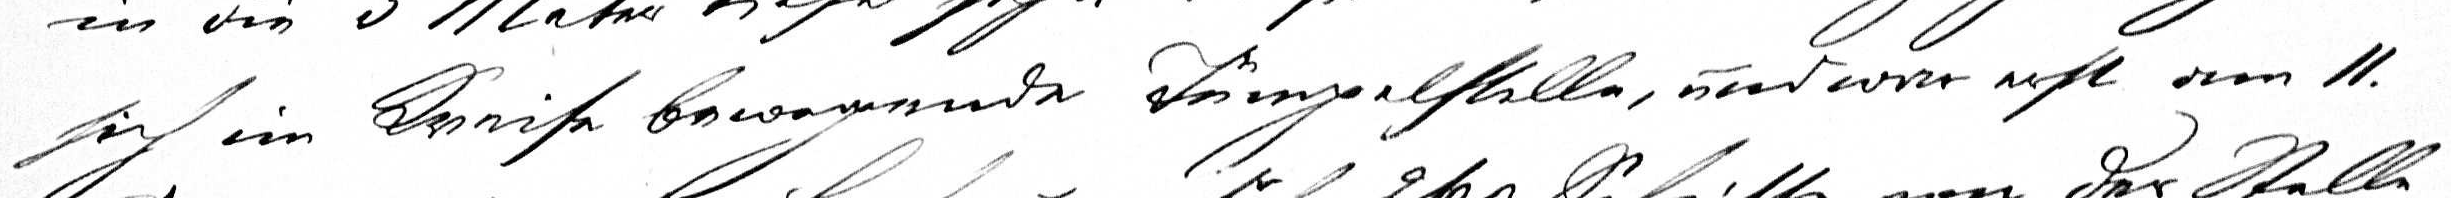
sich im Kreise bewegende Tümpelstelle, und war erst am 11.
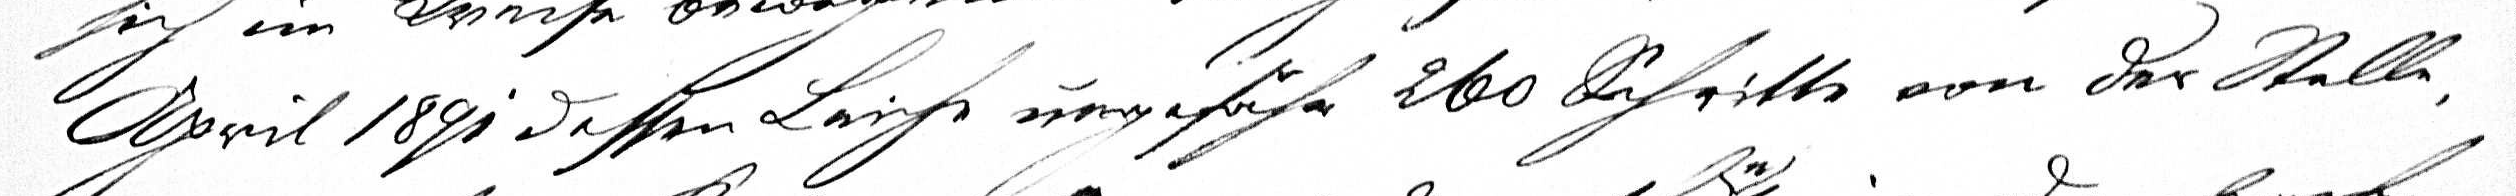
April 1891 dessen Leiche ungefähr 260 Schritte von der Stelle
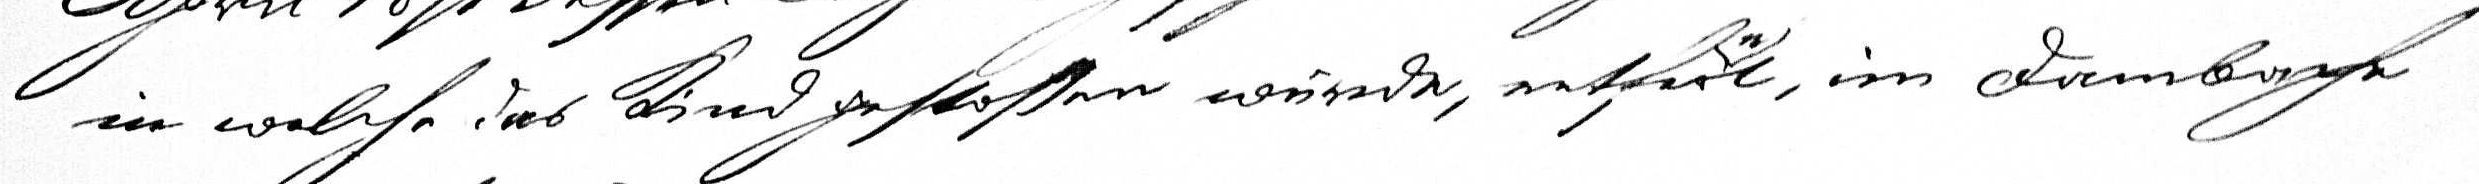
in welche das Kind gestoßen wurde, entfernt, im Dambache
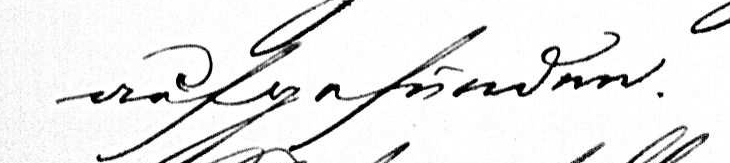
aufgefunden.
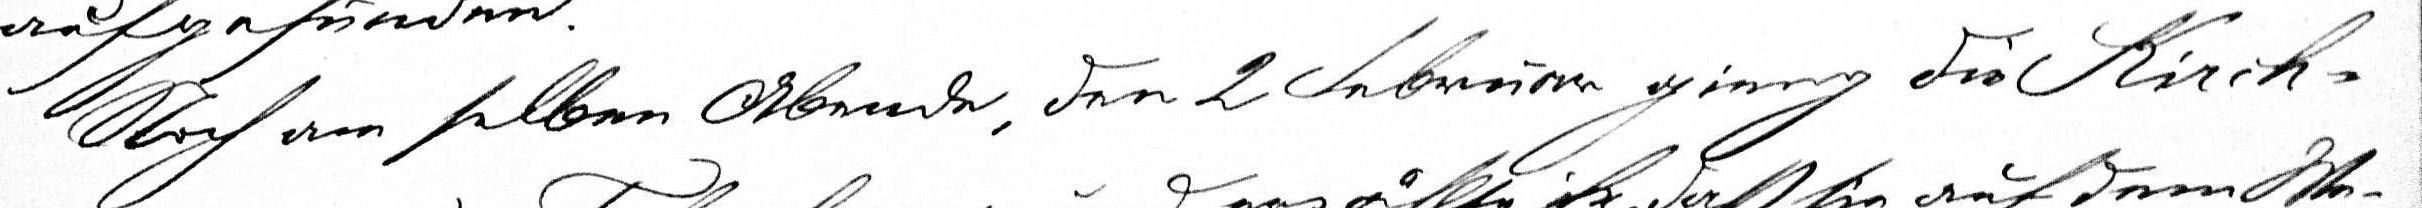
Noch am selben Abende, den 2 Februar gieng die Kirch¬
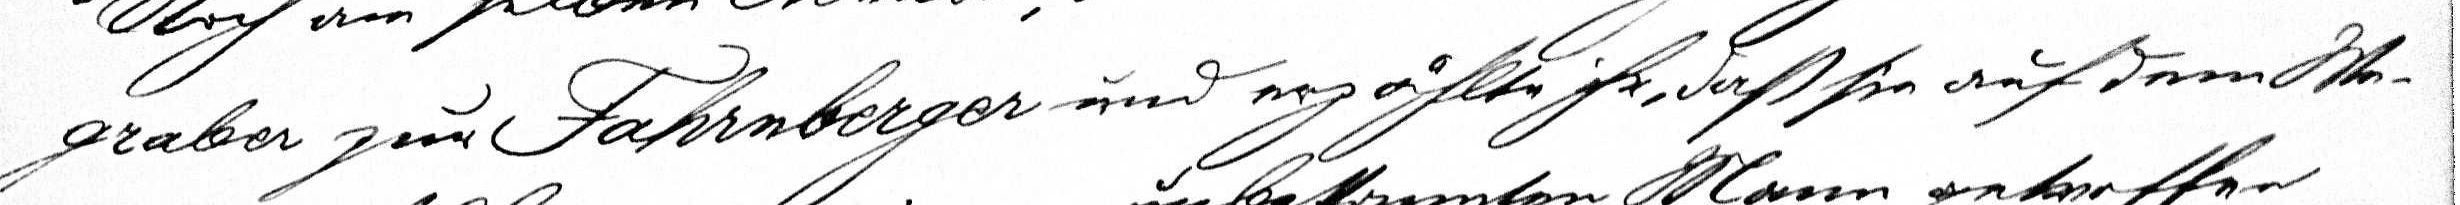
graber zur Fahrnberger und erzählte ihr, daß sie auf dem We¬
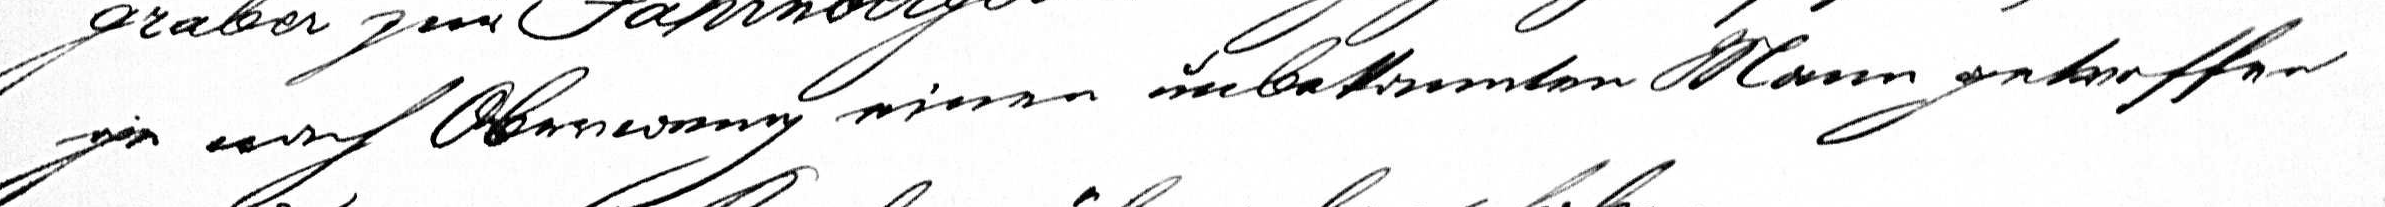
ge nach Oberweng einen unbekannten Mann getroffen
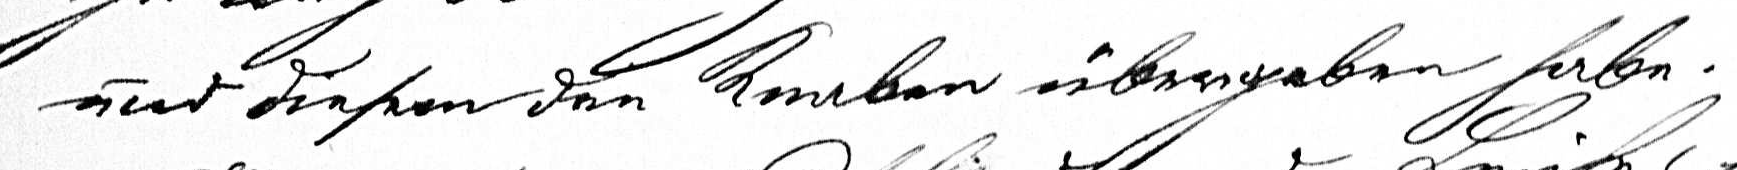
und diesem den Knaben übergeben habe.
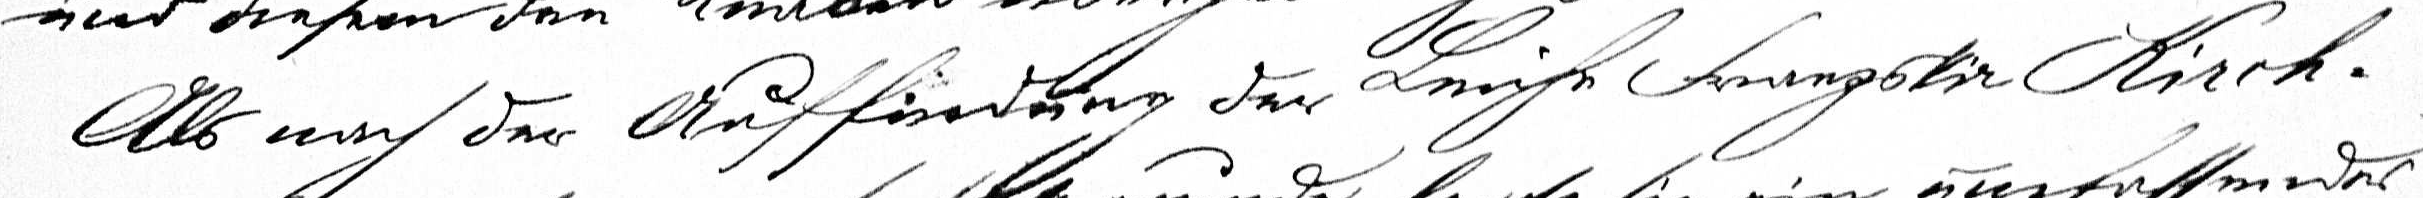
Als nach der Auffindung der Leiche Franziska Kirch¬
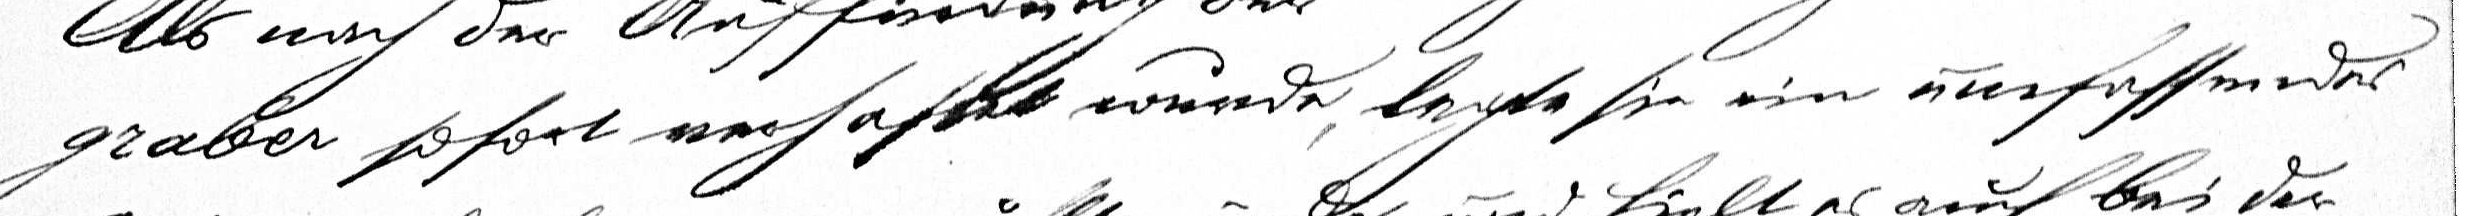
graber sofort nachahnt wurde, legte sie ein umfassendes
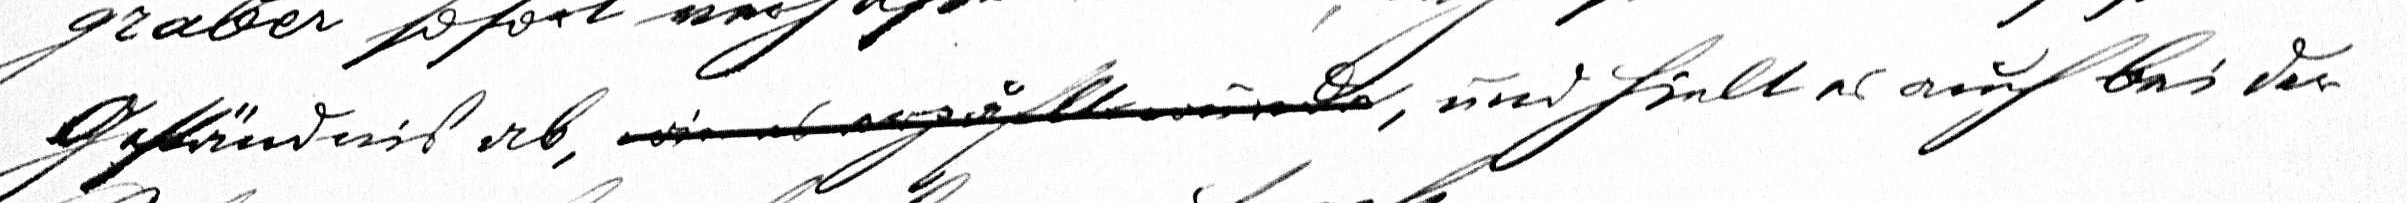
Geständnis ab, und hielt es auch bei der
